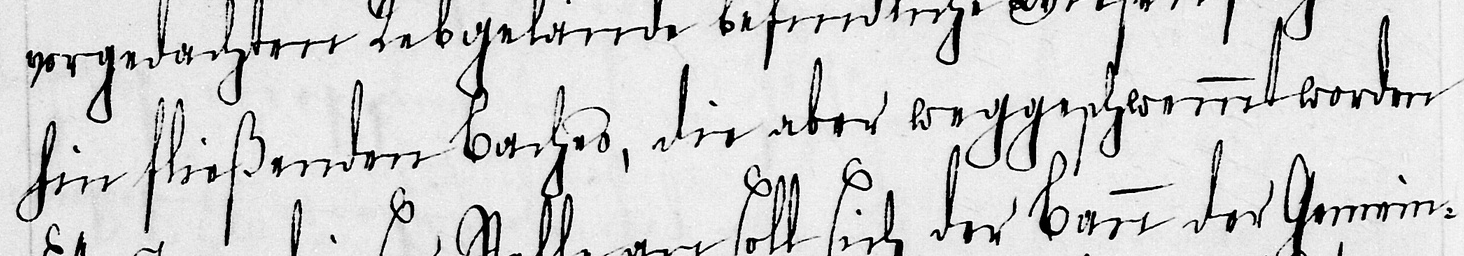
hin fließenden Baches, die aber weggeschwemmt worden
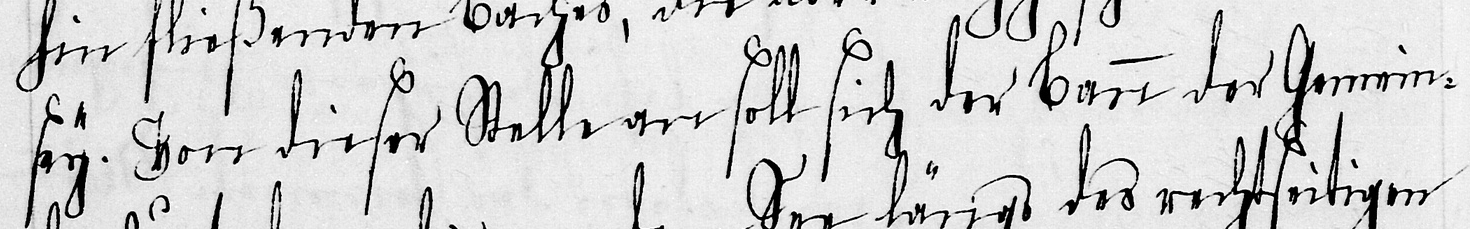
sey. Von dieser Stelle an soll sich der Bann der Gemein¬
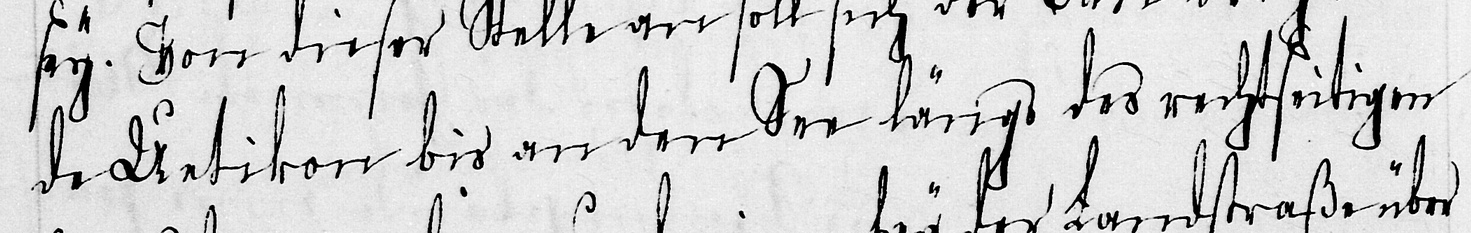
de Uetikon bis an den See längs des rechtseitigen
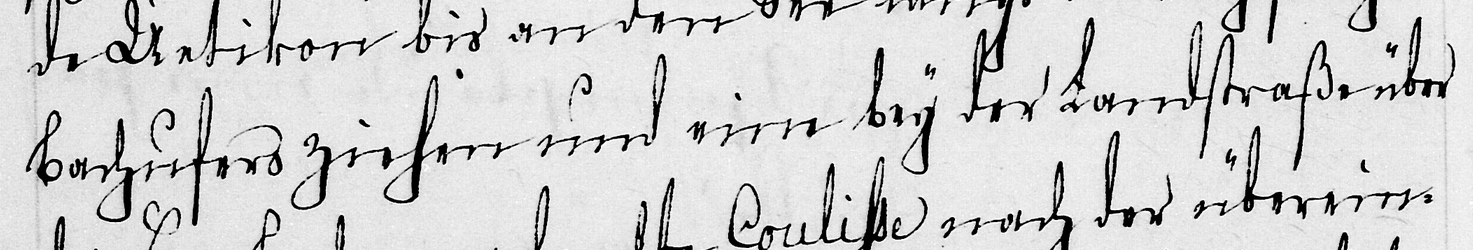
Bachufers ziehen und eine bey der Landstraße über
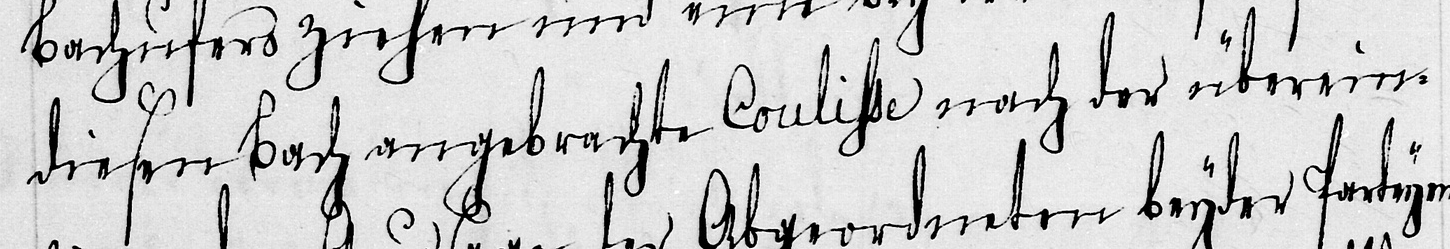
diesen Bach angebrachte Coulisse nach der überein¬
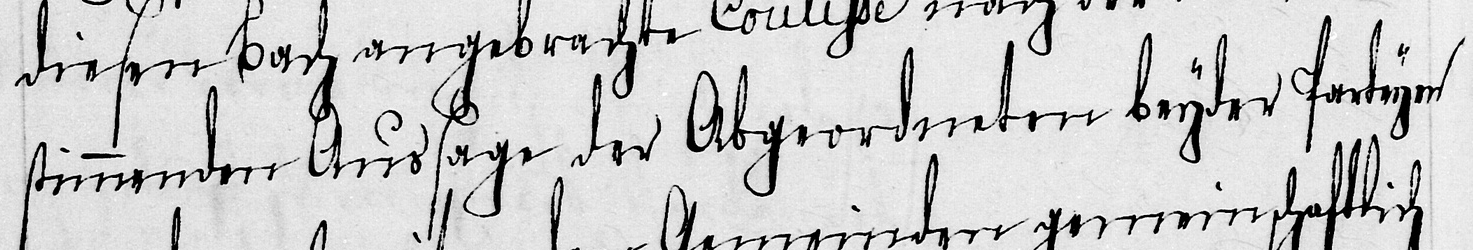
stimmenden Aussage der Abgeordneten beyder Parteyen
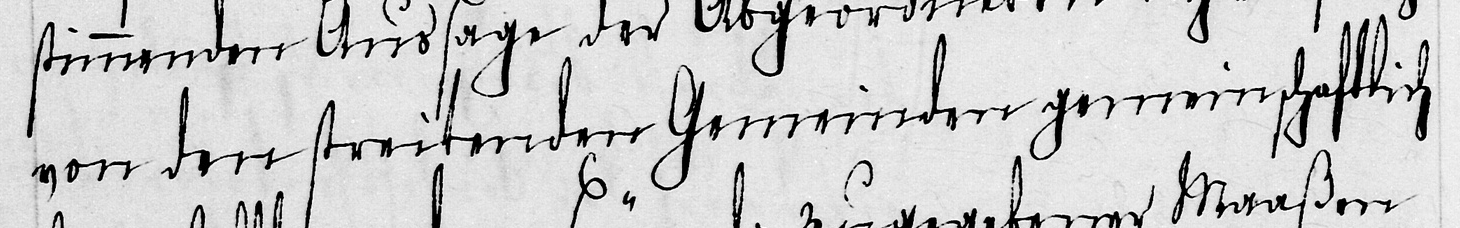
von den streitenden Gemeinden gemeinschaftlich
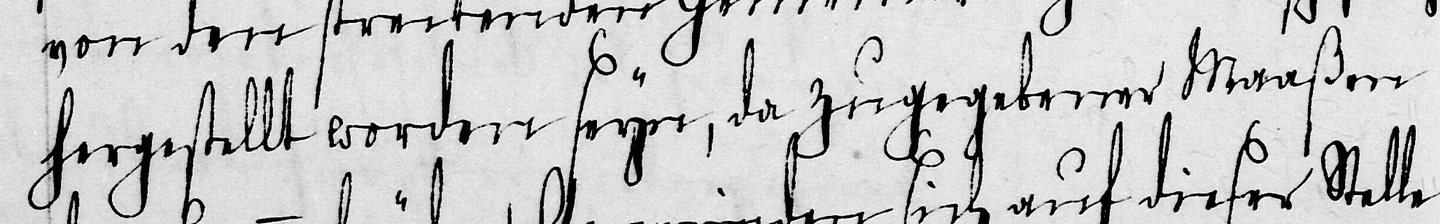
hergestellt seyn, da zugegebener Maaßen
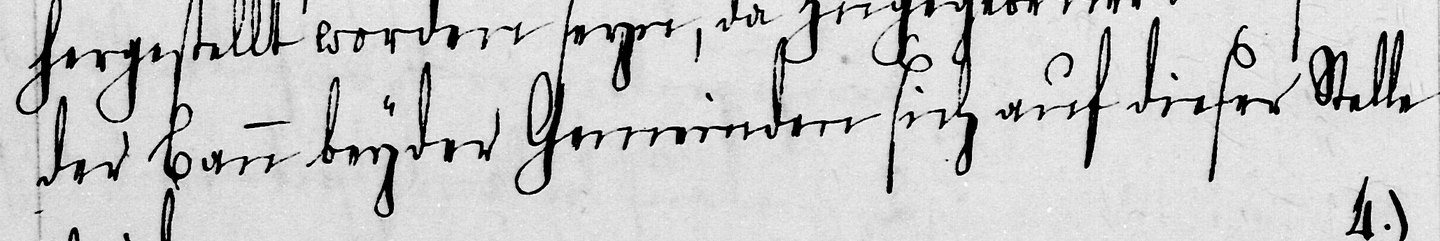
der Bann beyder Gemeinden sich auf dieser Stel¬
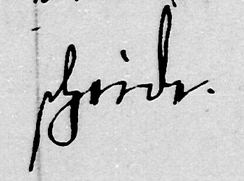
scheide.
